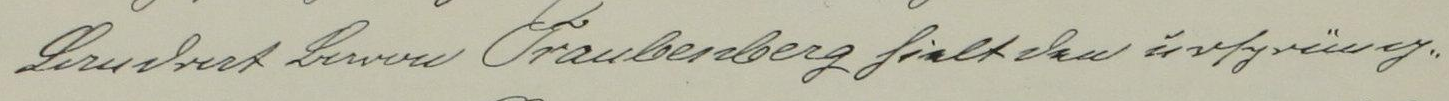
Landrat Baron Traubenberg hielt den ursprüng-
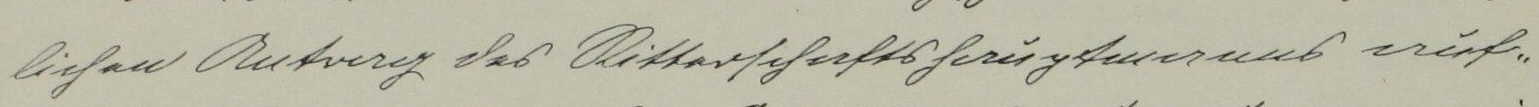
lichen Antrag des Ritterschaftshauptmanns auf-
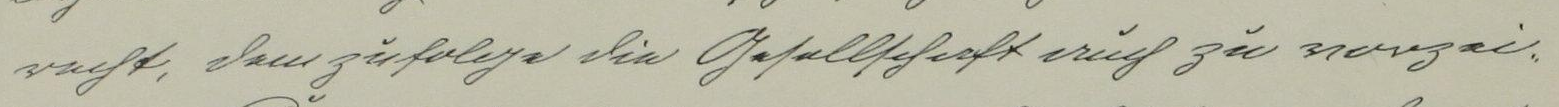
recht, dem zufolge die Gesellschaft auch zu vorzei-
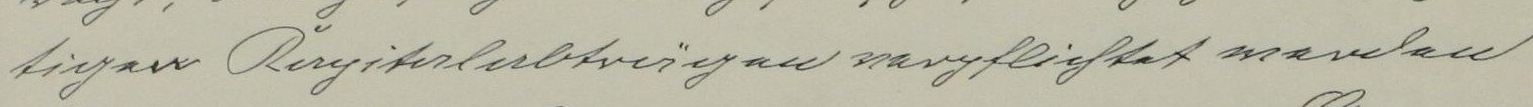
tigen Kapitalabträgen verpflichtet werden
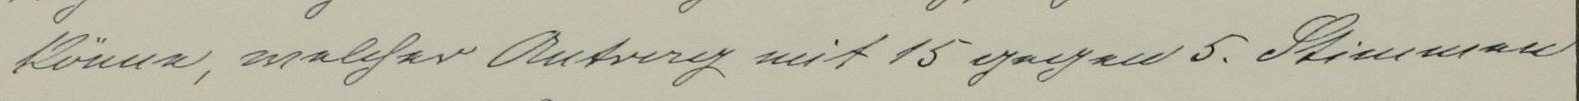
könne, welcher Antrag mit 15 gegen 5. Stimmen
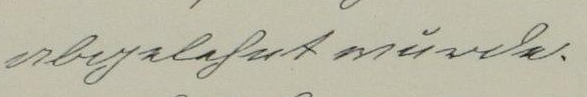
abgelehnt wurde.
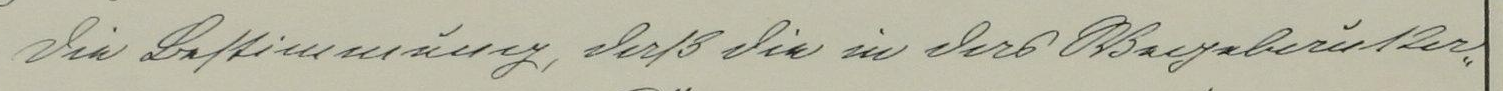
Die Bestimmung, daß die in das Wegebauka-
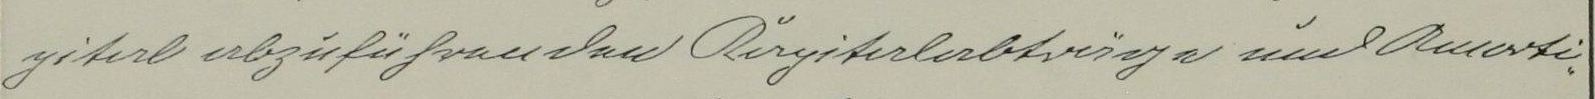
pital abzuführenden Kapitalabträge und Amorti-
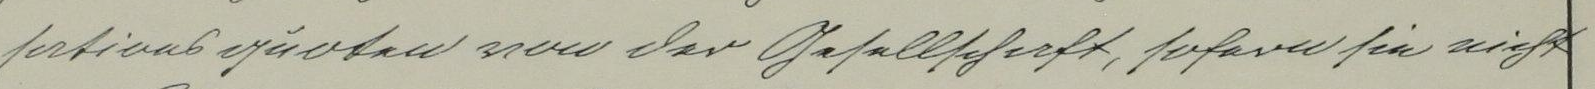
sationsquoten von der Gesellschaft, sofern sie nicht
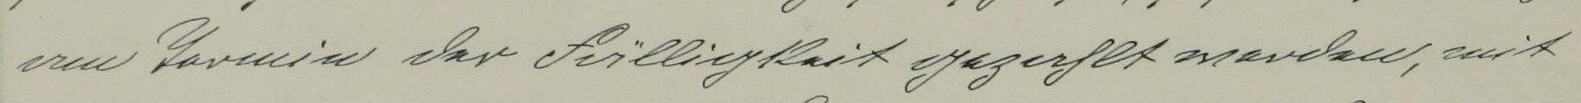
am Termin der Fälligkeit gezahlt werden, mit
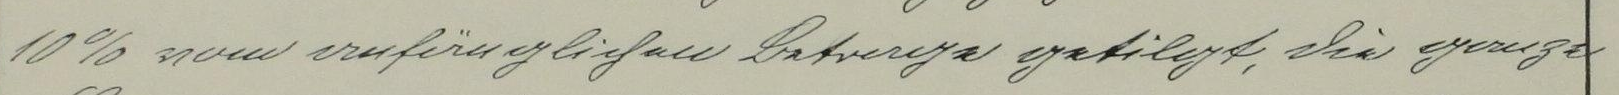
10% vom anfänglichen Betrage getilgt, die ganze
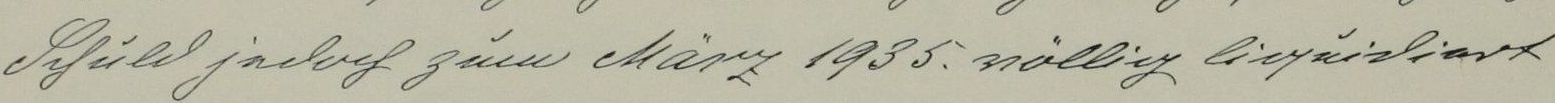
Schuld jedoch zum März 1935. völlig liquidiert
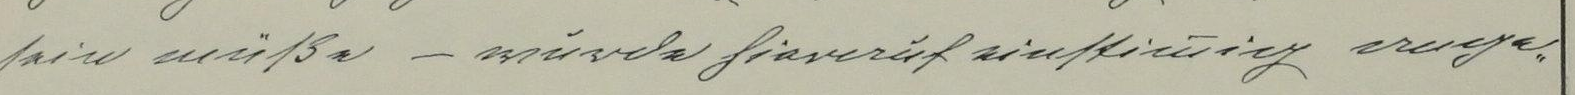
sein müße - wurde hierauf einstimmig ange-
